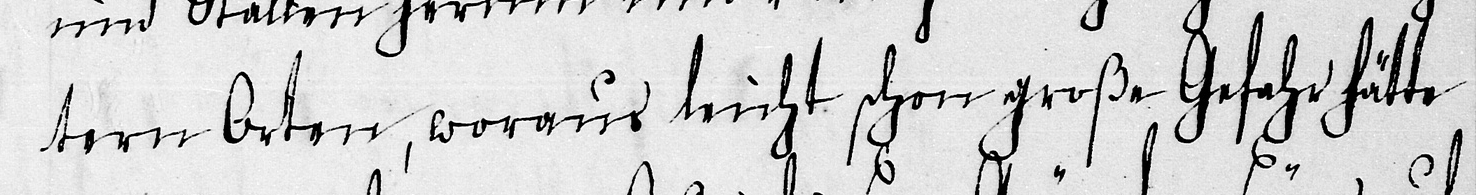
tern Orten, woraus leicht schon große Gefahr hätte
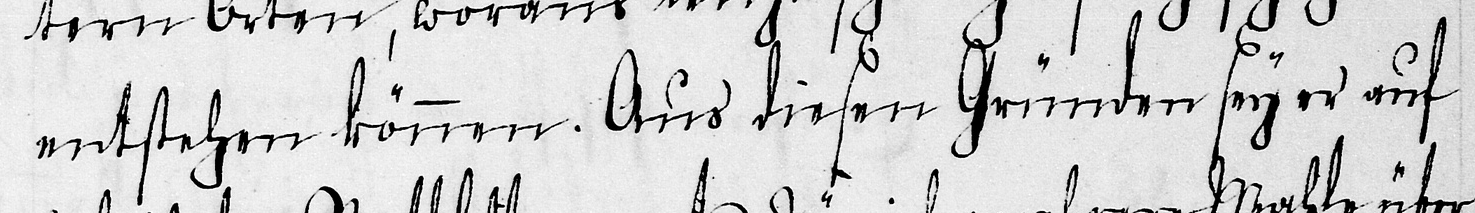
entstehen können. Aus diesen Gründen sey er auf
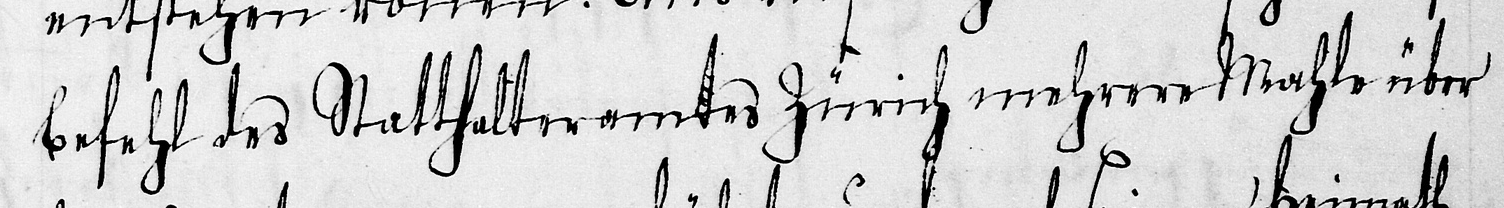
Befehl des Statthalteramtes Zürich mehrere Mahle über
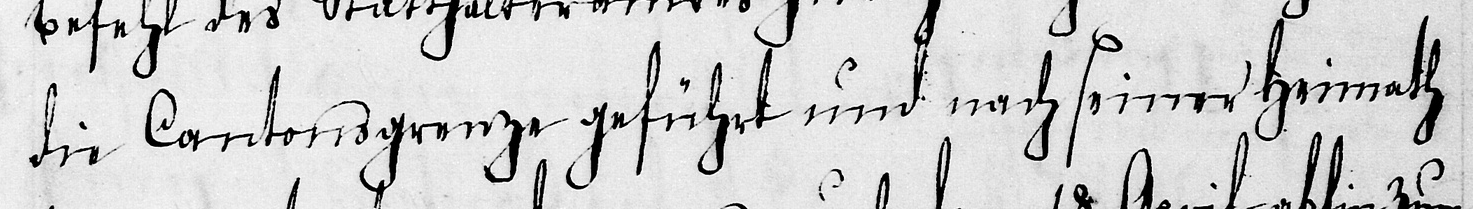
die Cantonsgrenze geführt und nach seiner Heimath
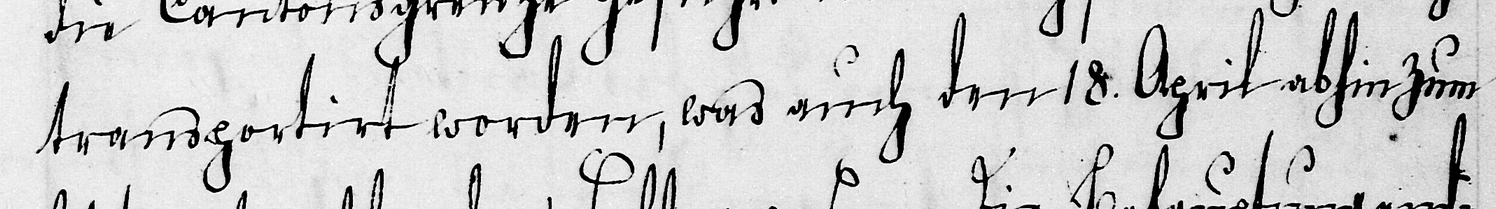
transportirt worden, was auch den 18. April abhin zu
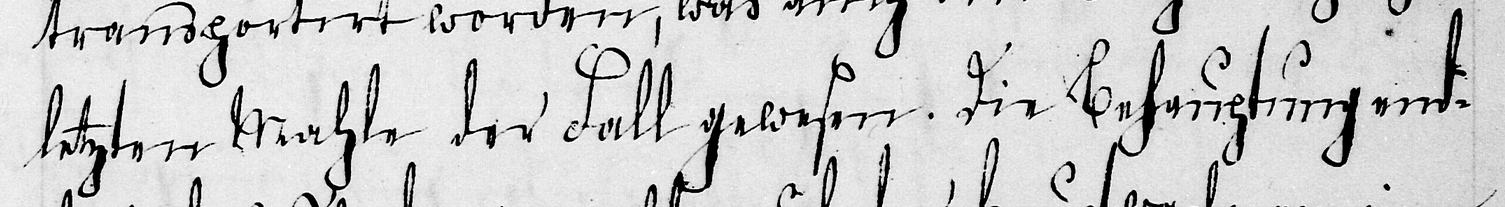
letzten Mahle der Fall gewesen. Die Behauptung end¬
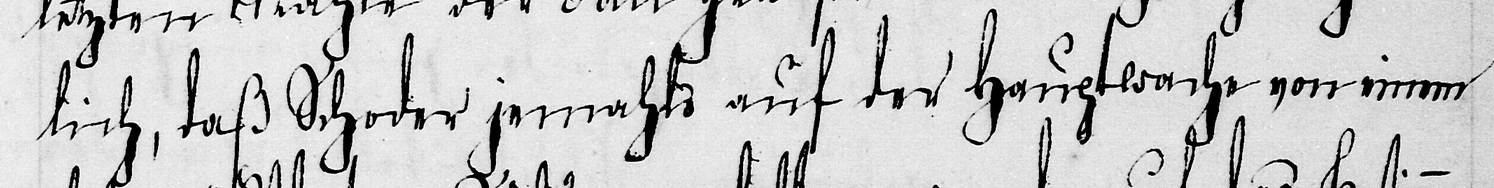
lich, daß Schoder jemahls auf der Hauptwache von einem
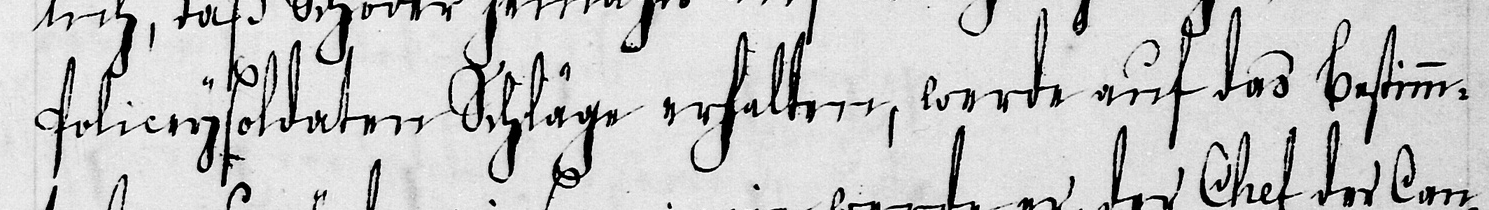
Policeysoldaten Schläge erhalten, werde auf das Bestim¬
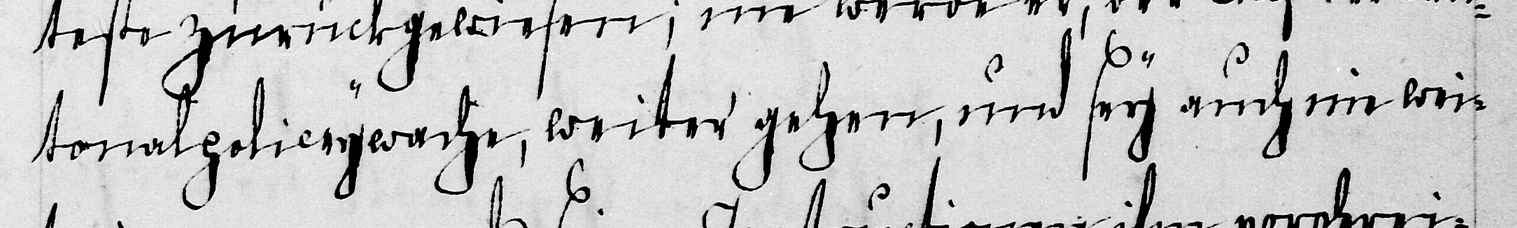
tonalpoliceywache, weiter gehen, und sey auch nie wei¬
